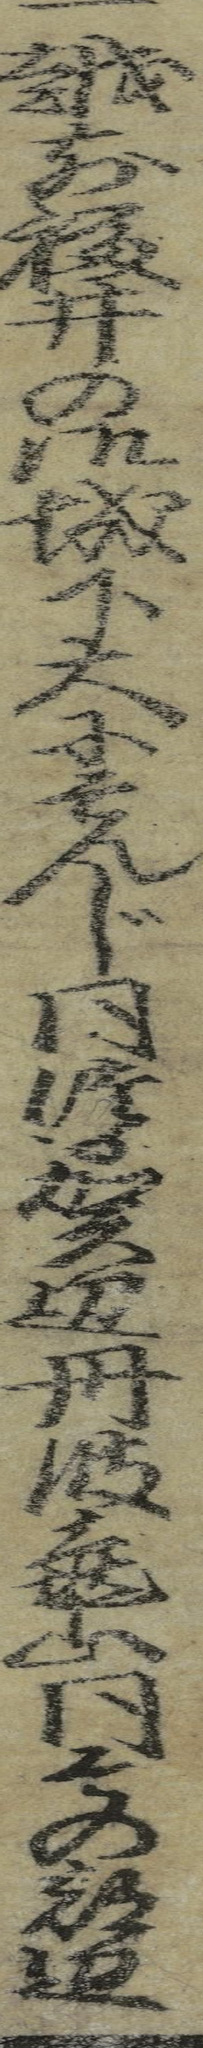一越前福井の御城下大にそんじ同つる賀辺丹波亀山同その部辺
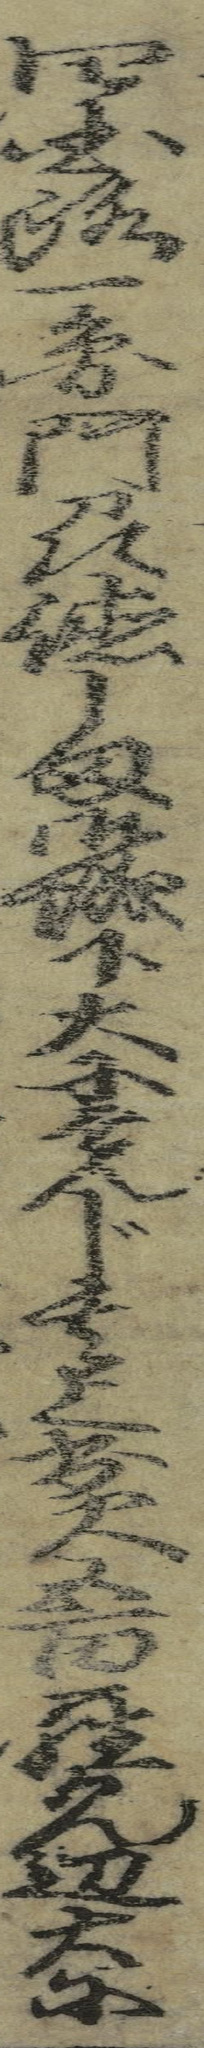四国路一圓阿州徳しま御城下大にそんじ其上出火五百羅かん辺大に
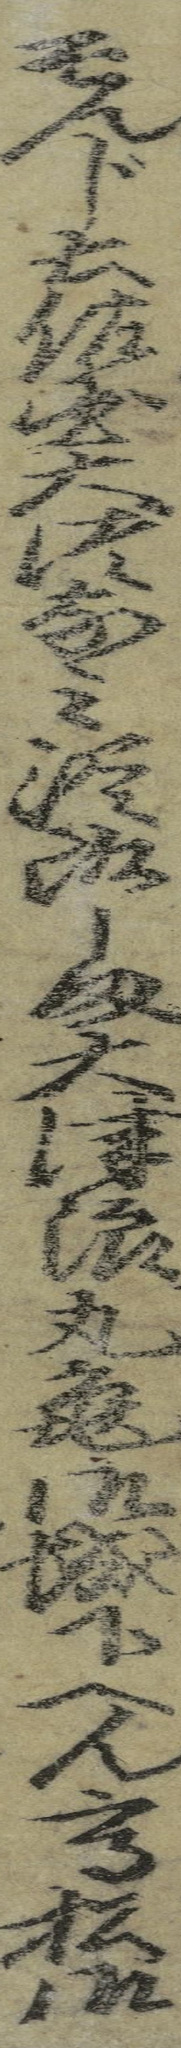そんじ土佐国大つなミ淡路しま大津浪丸亀御城下辺高松御
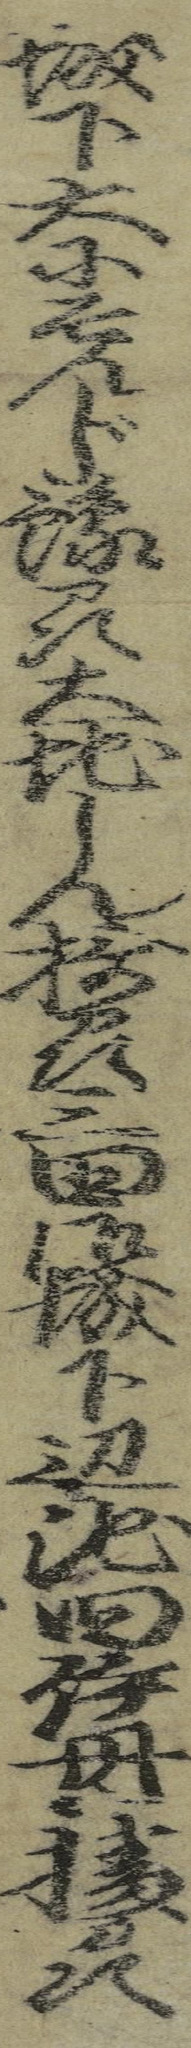城下大にそんじ豫州大地しん摂州三田御城下辺池田伊丹播州
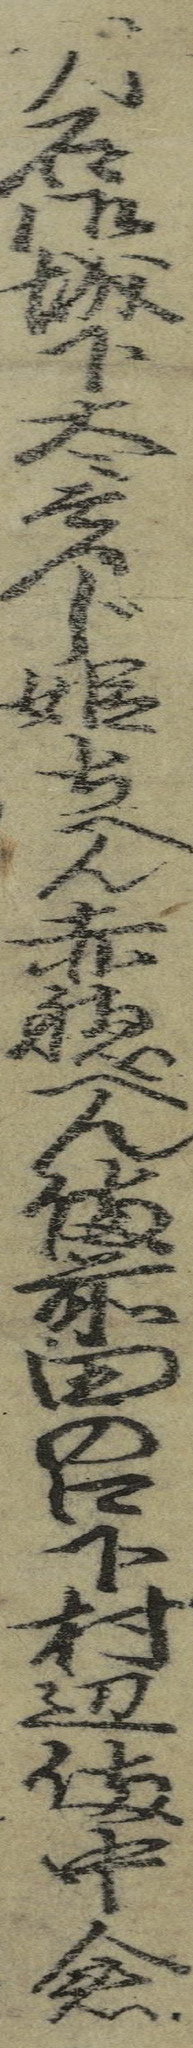明石御城下大そんじ姫ちへん赤穂辺備前田の口下村辺備中倉
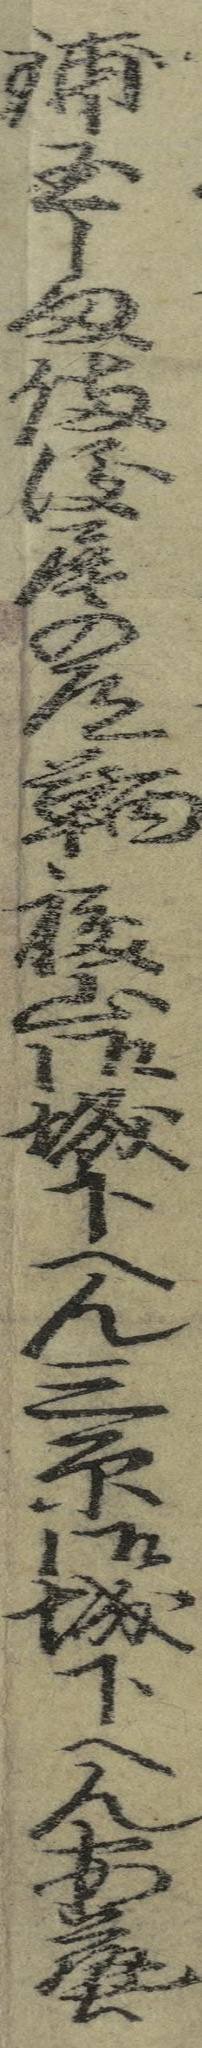敷玉しま備後尾の道鞆福山御城下へん三原御城下へん安芸
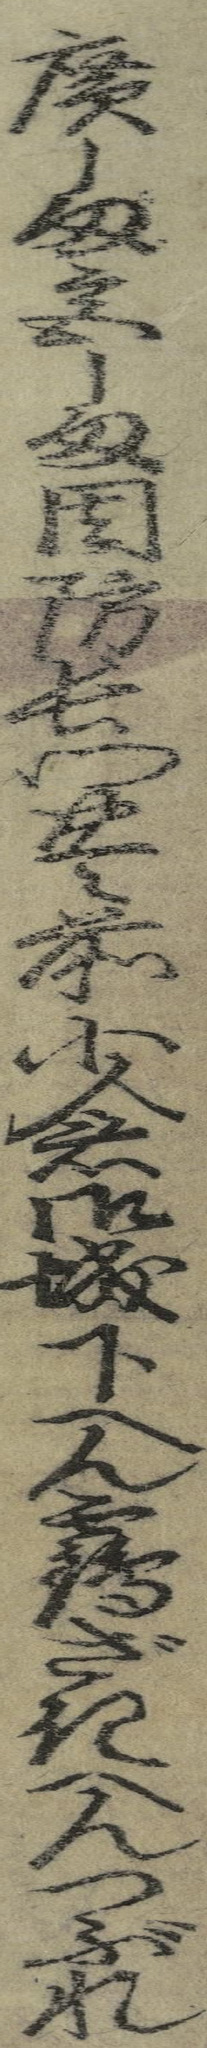廣しま宮しま周防長門豊前小倉御城下へん鶴ざきへんつぶれ
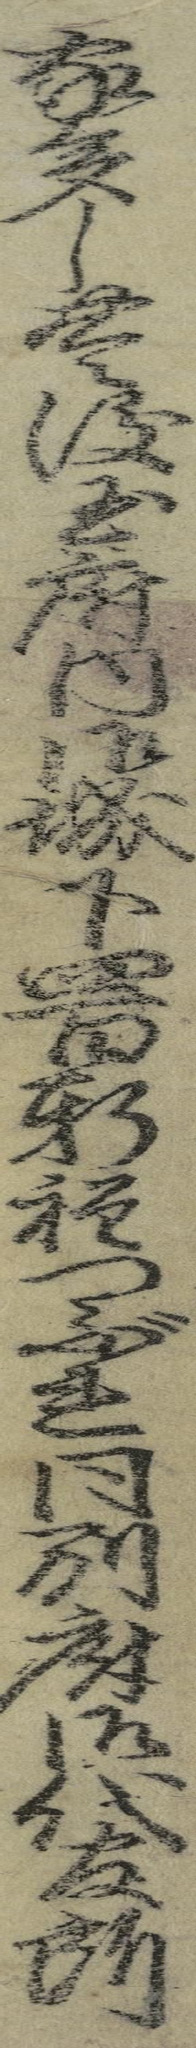家多し豊後国府内御城下四百軒程つぶれ同別府御代官所
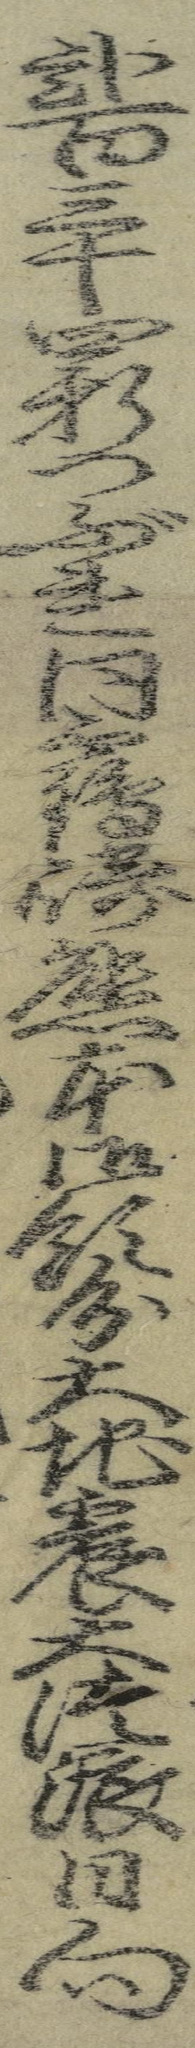弐百三十四軒つぶれ同鶴崎熊本御領分大地震大つ浪日向
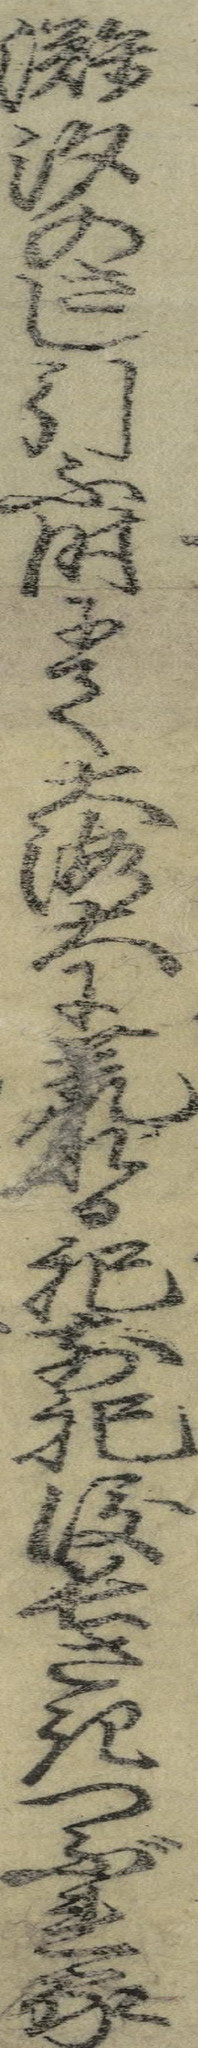灘汐のさし疋不時にて大海大に荒れる肥前肥後長さきつぶれ家
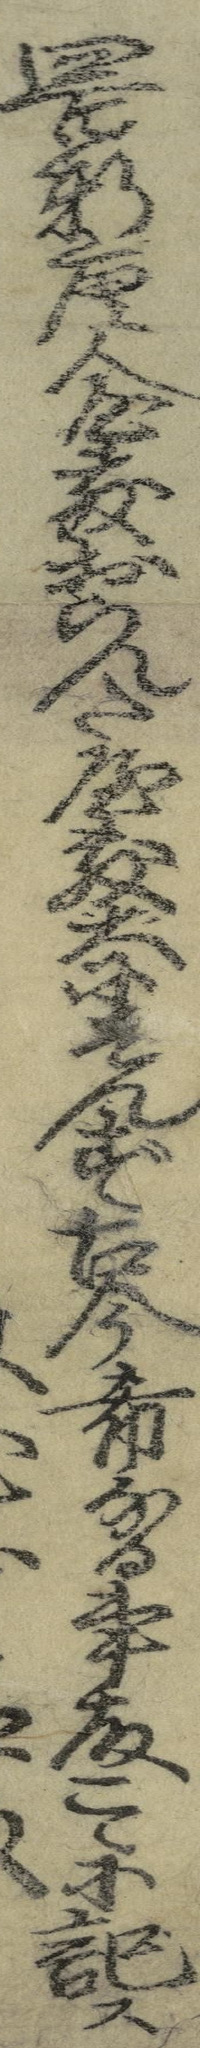四百軒唐人屋敷おらんた屋敷大にそんず古今希なる事故こゝに記ス
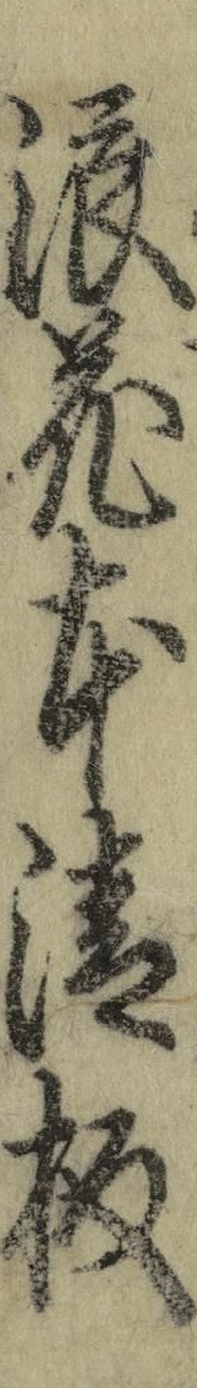浪花本清板
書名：大地震大津浪場所聞書上之覺
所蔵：東京大学地震研究所図書室 Earthquake Research Institute Library, The University of Tokyo, JAPAN
